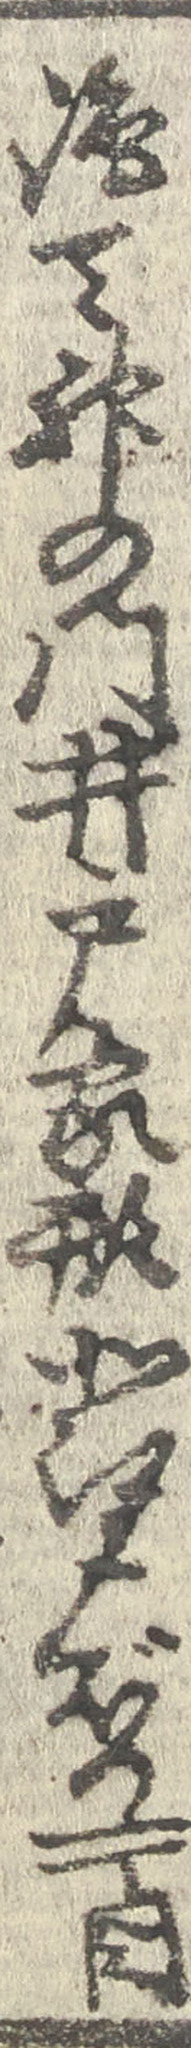嶋天神の門井戸家形北江戸ぼり一丁目
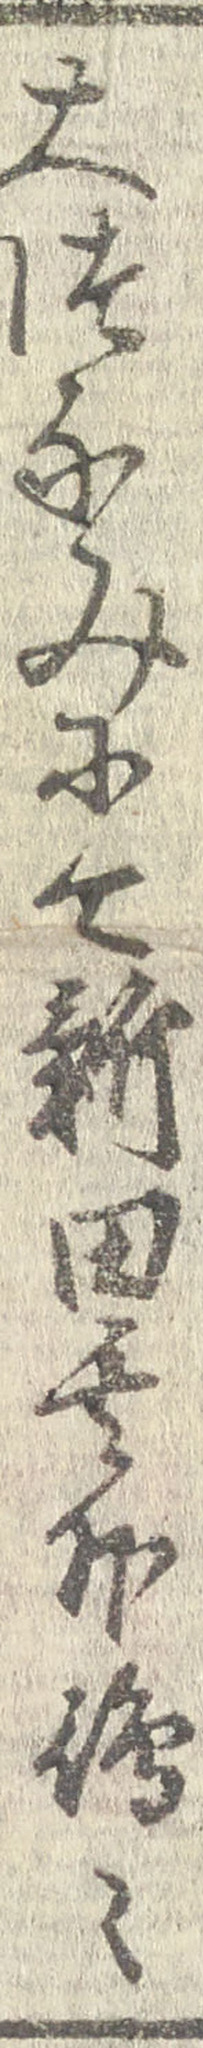大つなみにて新田其外島々
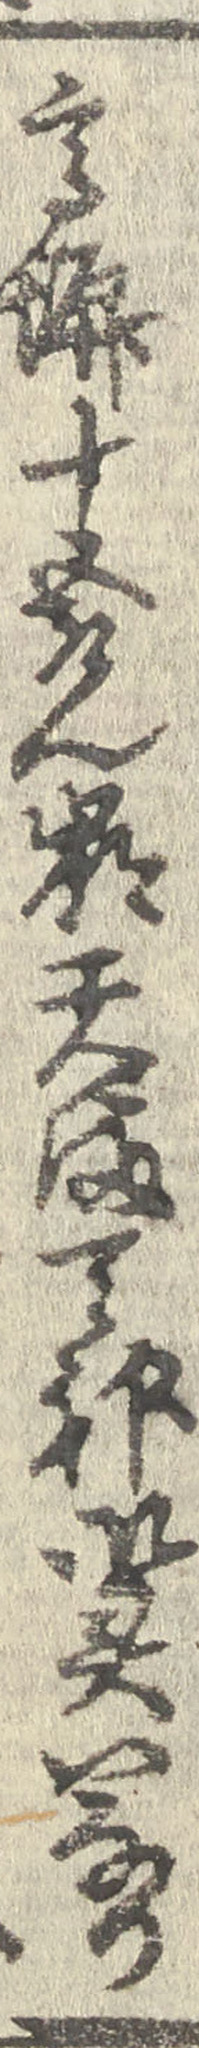高塀十五けん崩天満天神御霊いなり
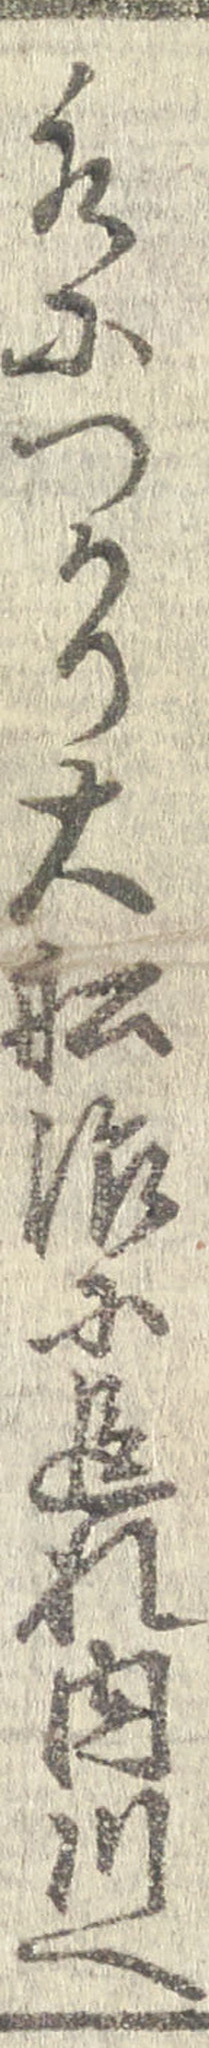水につかり大船浪に追れ内川へ
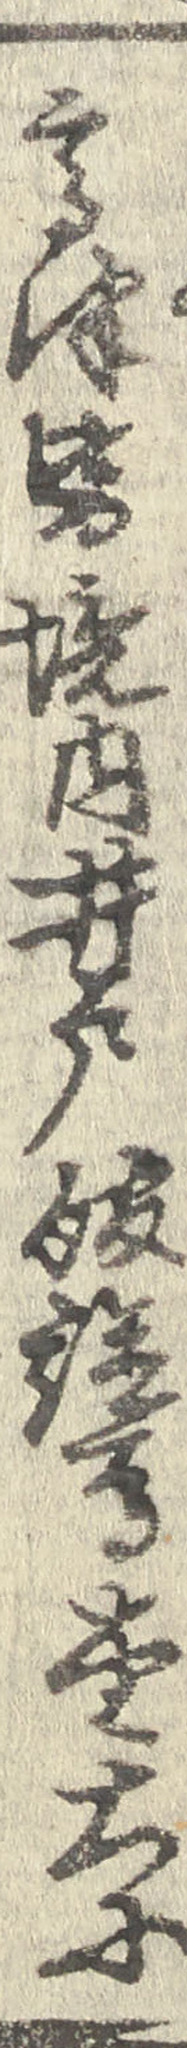高津皆境内井戸館絵馬堂大に
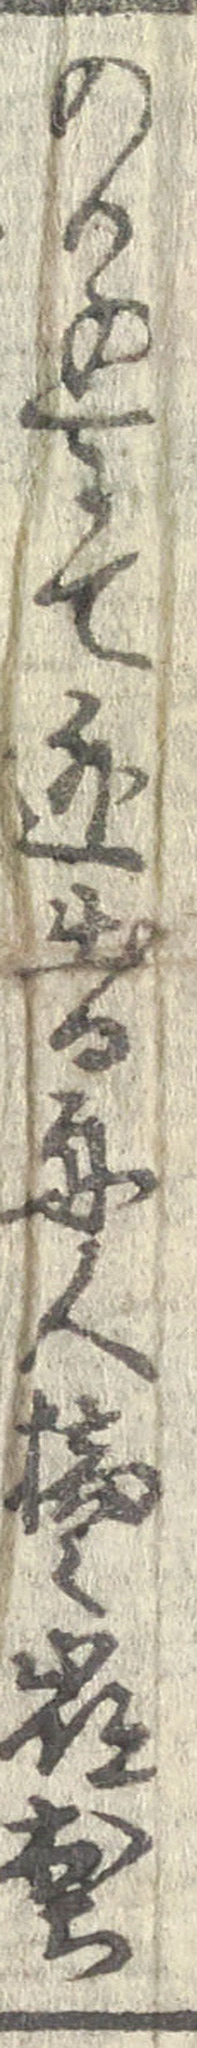のり込にて逃出る舟人橋々崩おち
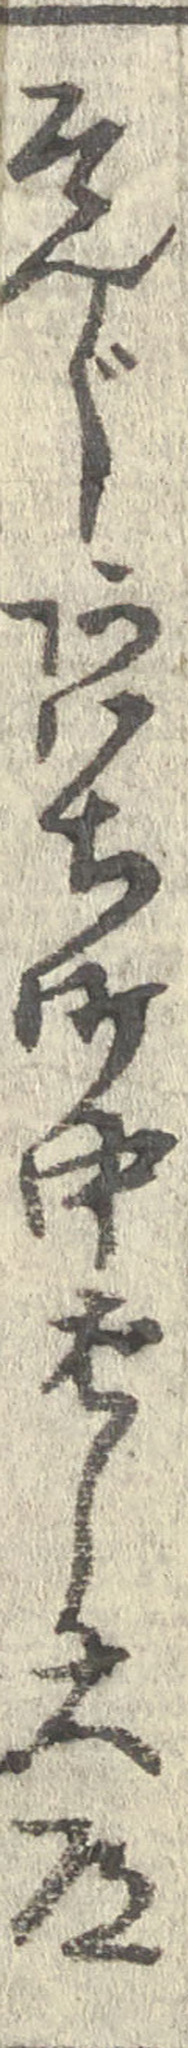そんじあはち町中ばし大道
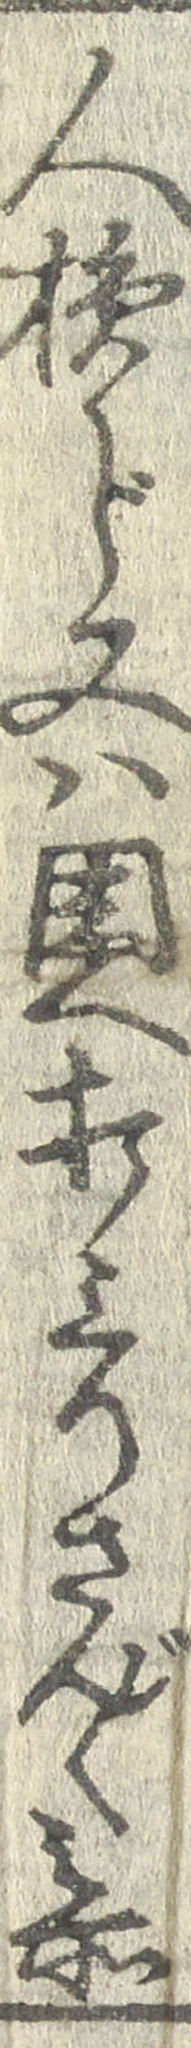人損じ又はへ打上りさん〴〵の所
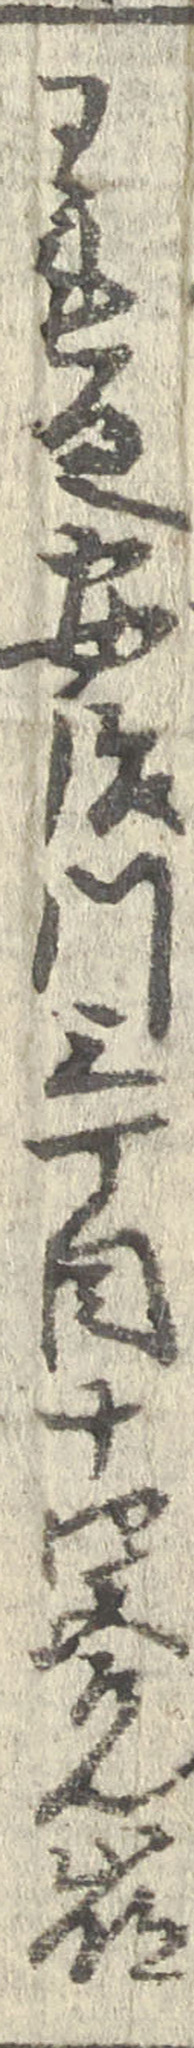われる也安治川三丁目十四五けん崩
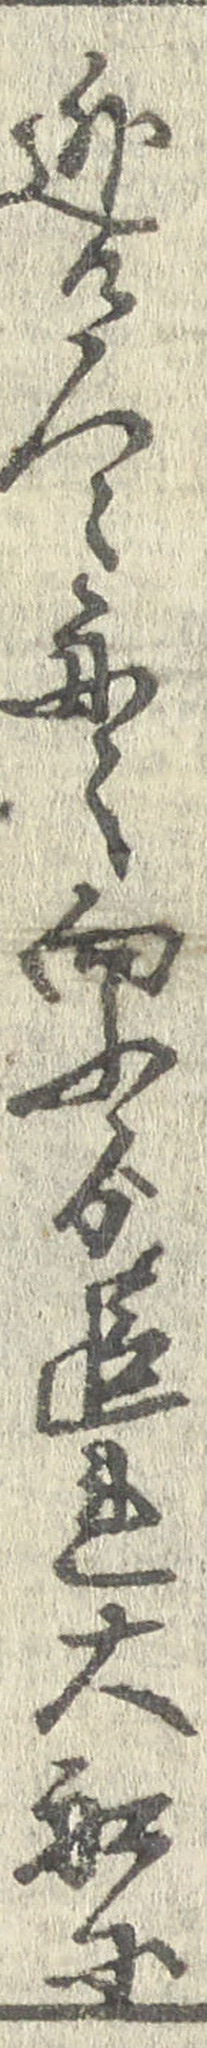逃る人々舟々向ふゟ追れ大船に
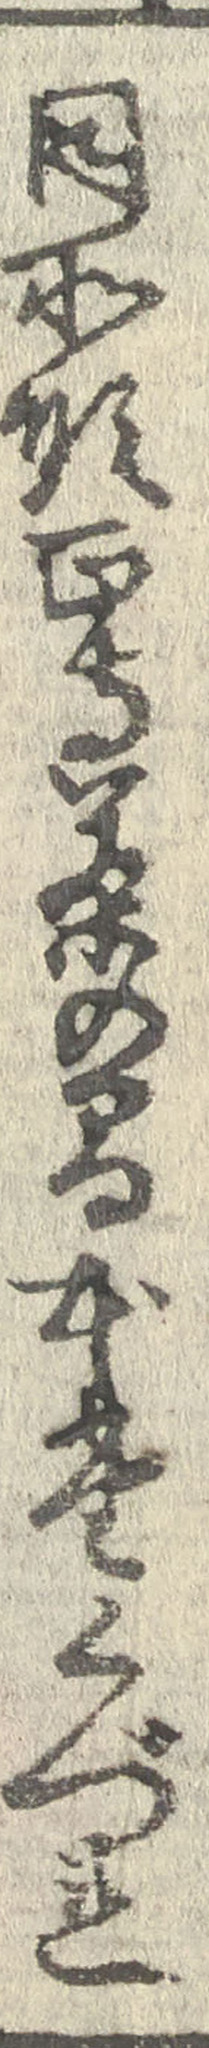同所順正寺茶の間本堂くづれ
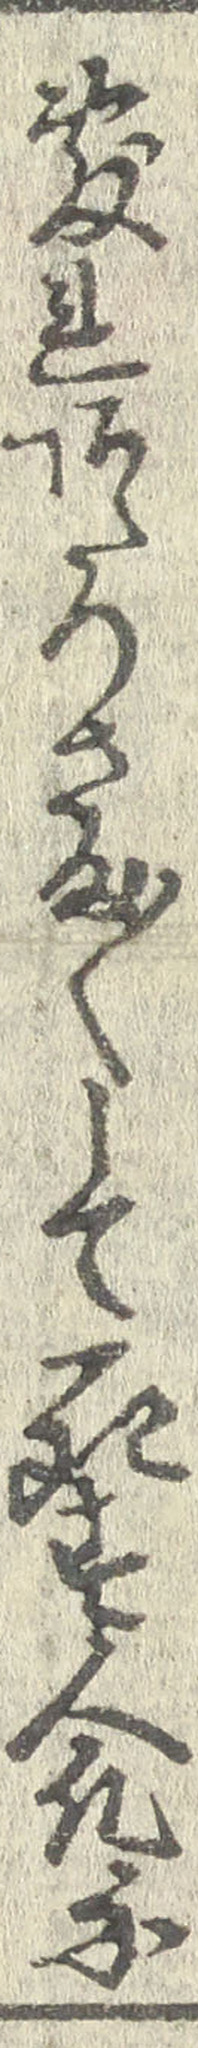敷れあたりさま〳〵して死す人凡千
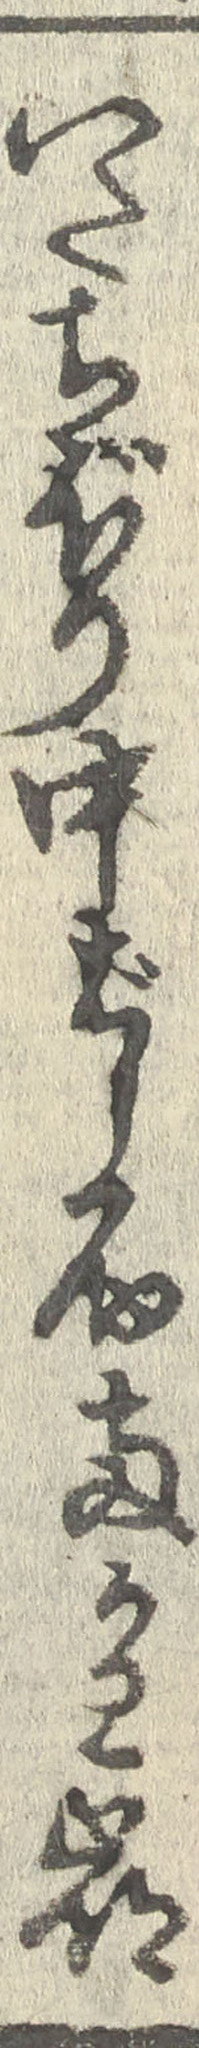いたちぼり中ばし両かわ崩
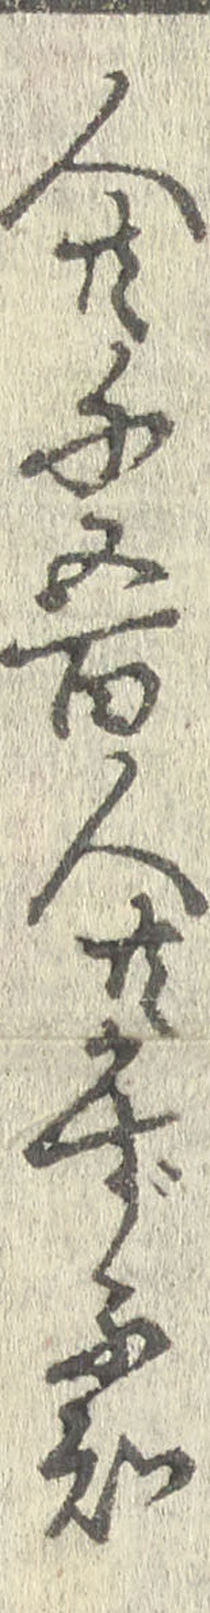人共千五百人共かず不知
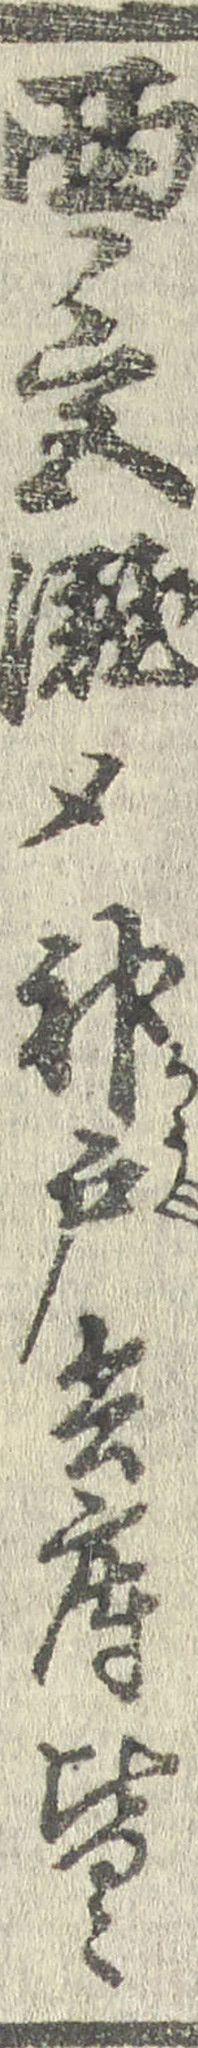西ノ宮灘め神戸兵庫皆々
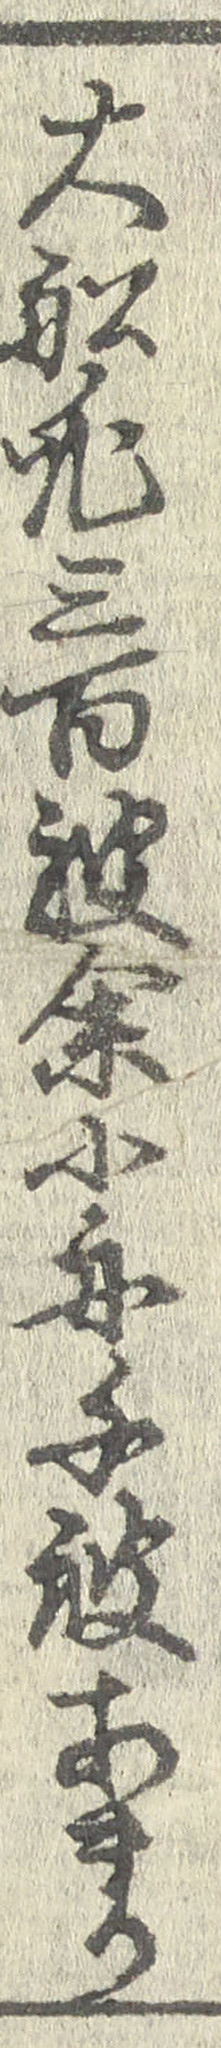大船凡三百艘余小舟千艘あまり
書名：聞書諸国并大阪大地震つなみ
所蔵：東京大学総合図書館 General Library in the University of Tokyo, JAPAN
